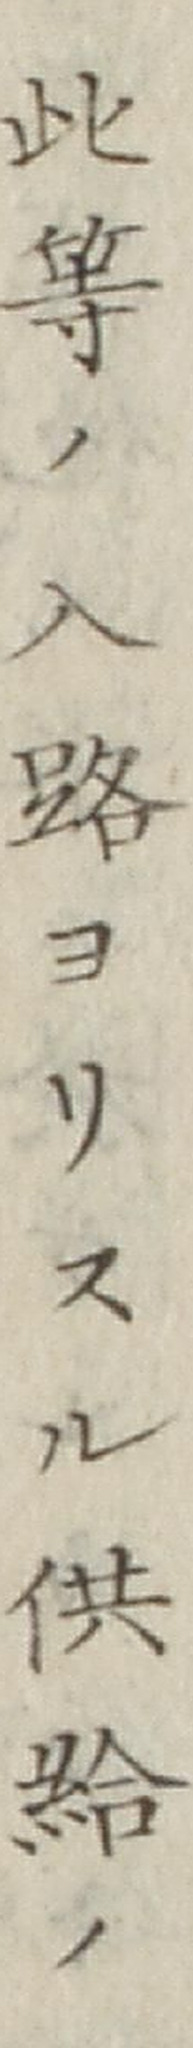此等ノ入路ヨリスル供給ノ
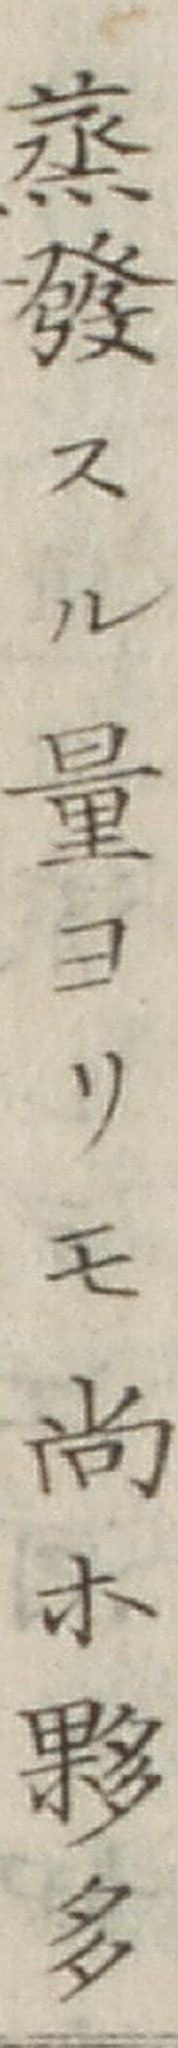蒸発スル量ヨリモ尚ホ夥多
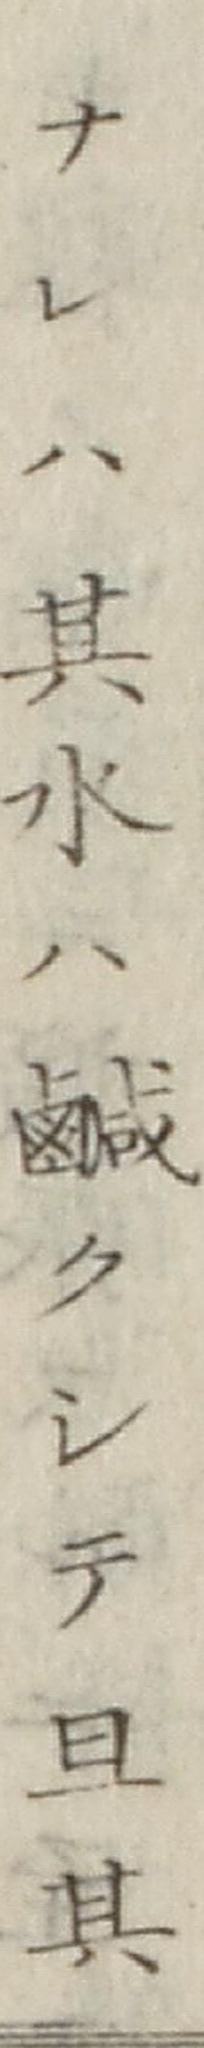ナレハ其水ハ鹹クシテ旦其
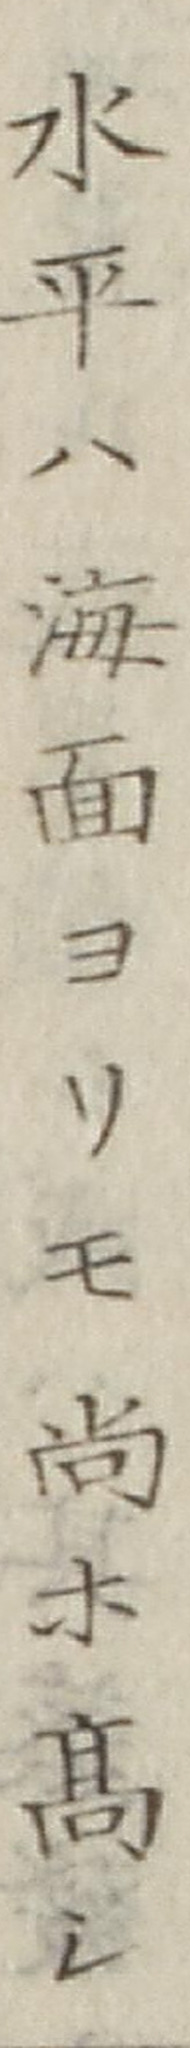水平ハ海面ヨリモ尚ホ高シ
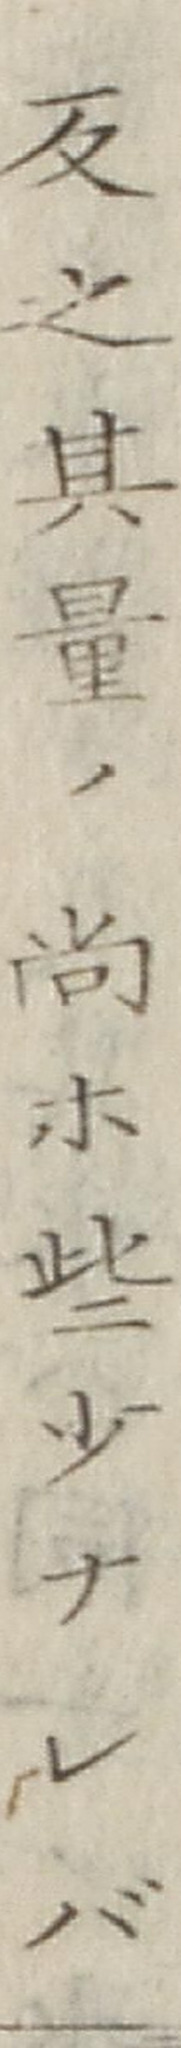反之其量ノ尚ホ些少ナレバ
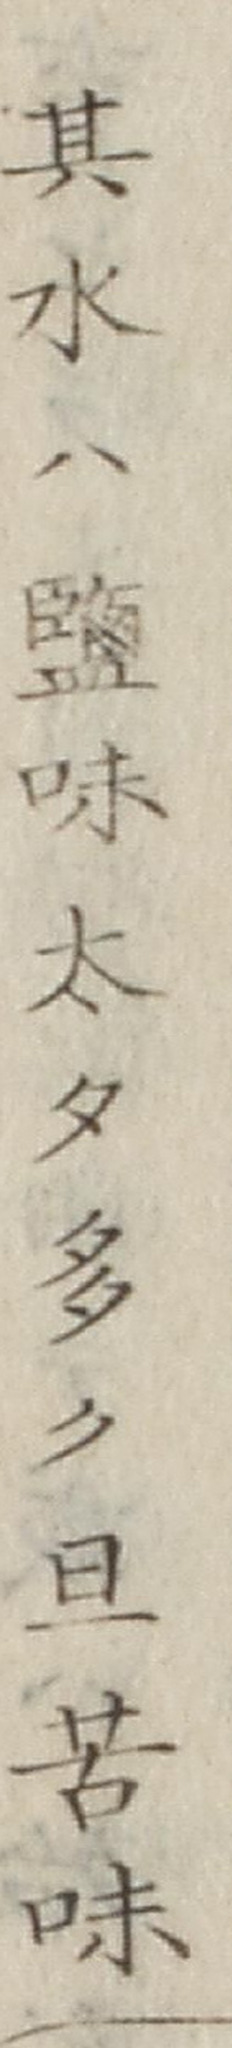其水ハ塩味太タ多ク旦苦味
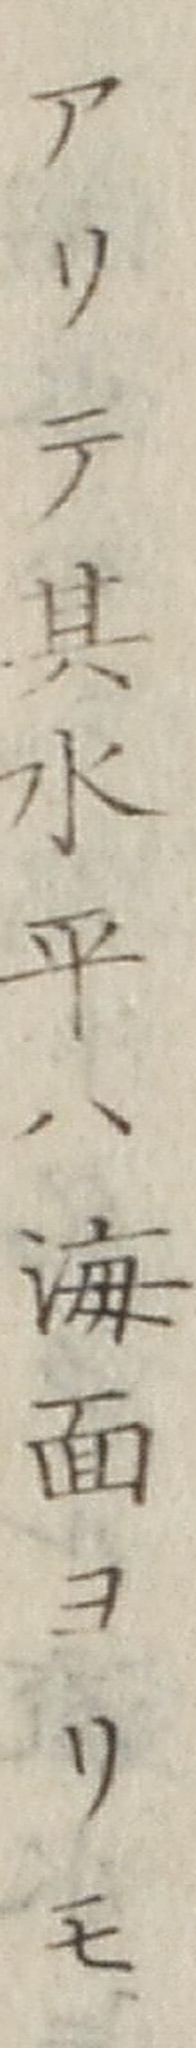アリテ其水平ハ海面ヨリモ
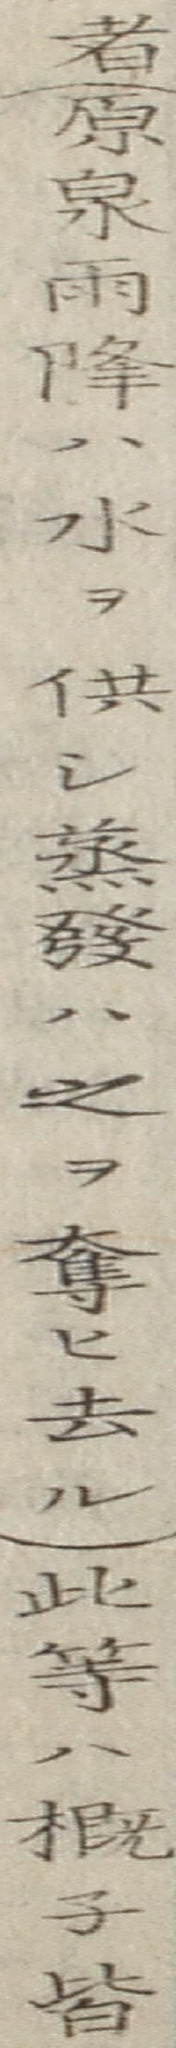者此等ハ概ね皆
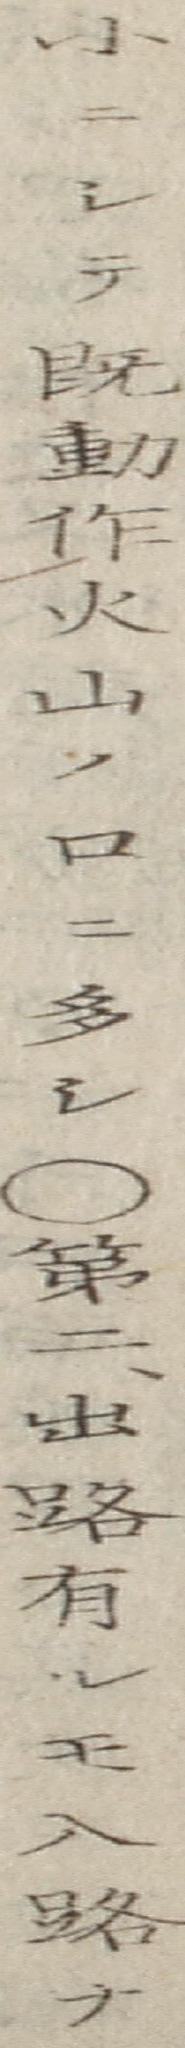小ニシテ既動作火山ノ口ニ多シ○第二、出路有ルモ入路ナ
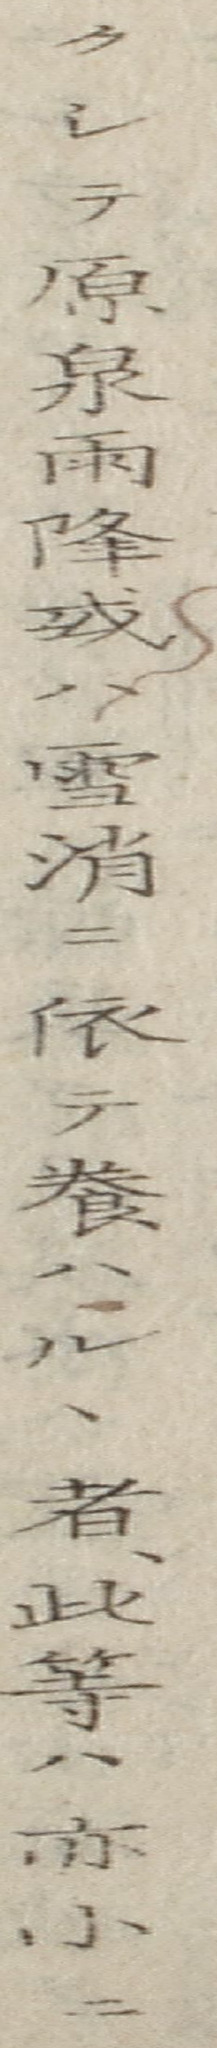クシテ原泉雨降或ハ雪消ニ依テ養ハルヽ者、此等ハ亦小ニ
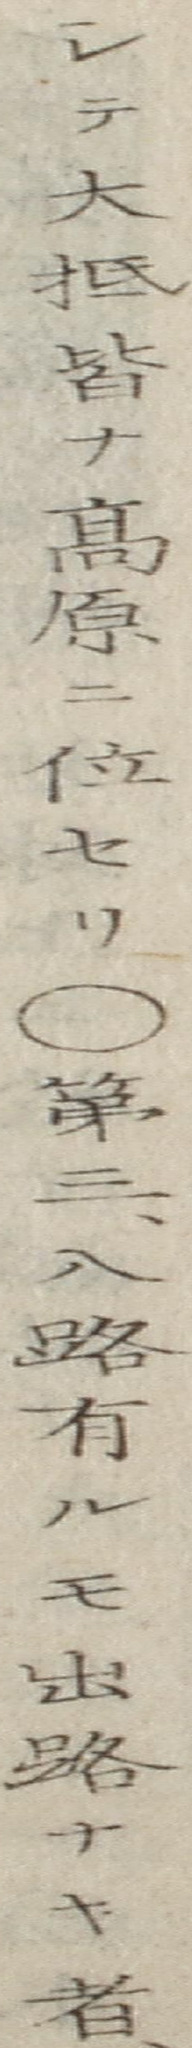シテ大抵皆ナ高原ニ位セリ○第三、入路有ルモ出路ナキ者、
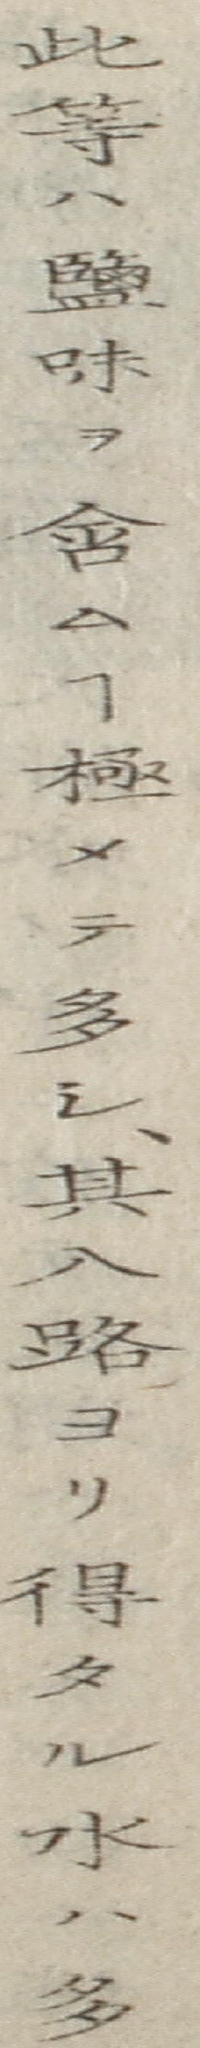此等ハ塩味ヲ含ムヿ極メテ多シ、其入路ヨリ得タル水ハ多
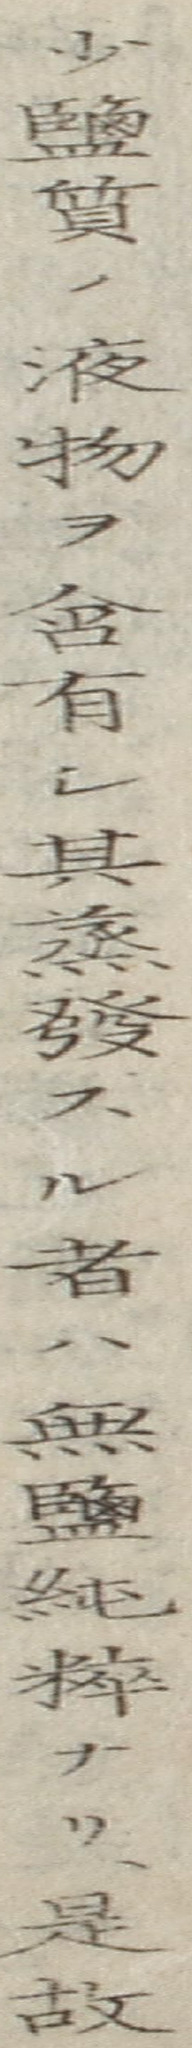少塩質ノ液物ヲ含有シ其蒸発スル者ハ無塩純粋ナリ、是故
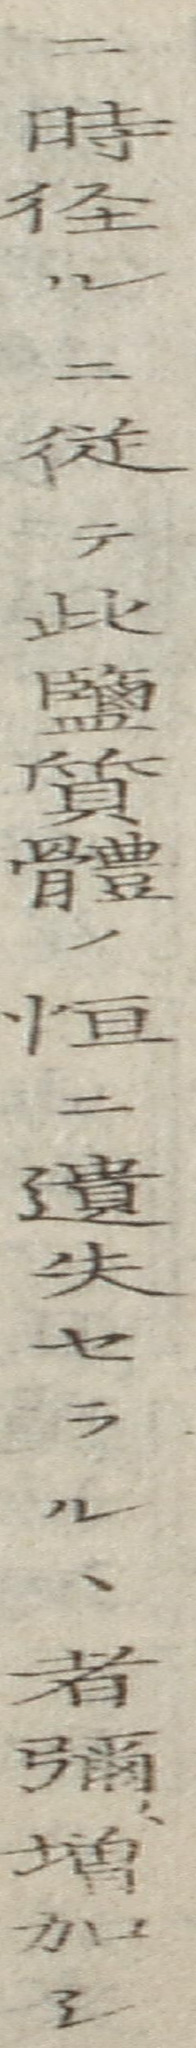ニ時径ルニ従テ此塩質体ノ恒ニ遺失セラルヽ者弥々増加シ
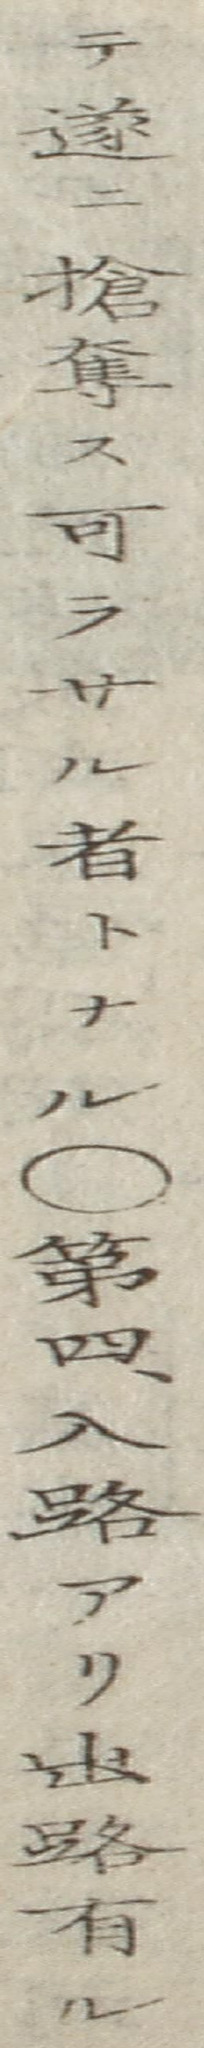テ遂ニ槍奪ス可ラサル者トナル○第四、入路アリ出路有ル
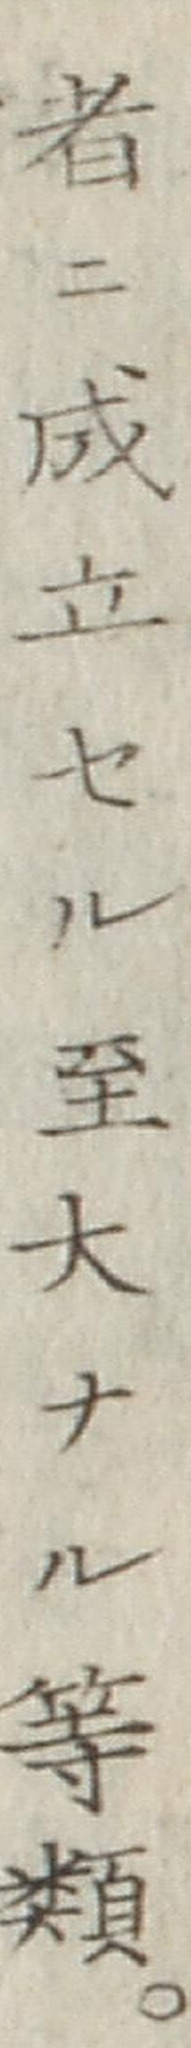者ニ成立セル至大ナル等類。
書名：地形論　巻二
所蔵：東京大学地震研究所図書室 Earthquake Research Institute Library, The University of Tokyo, JAPAN
